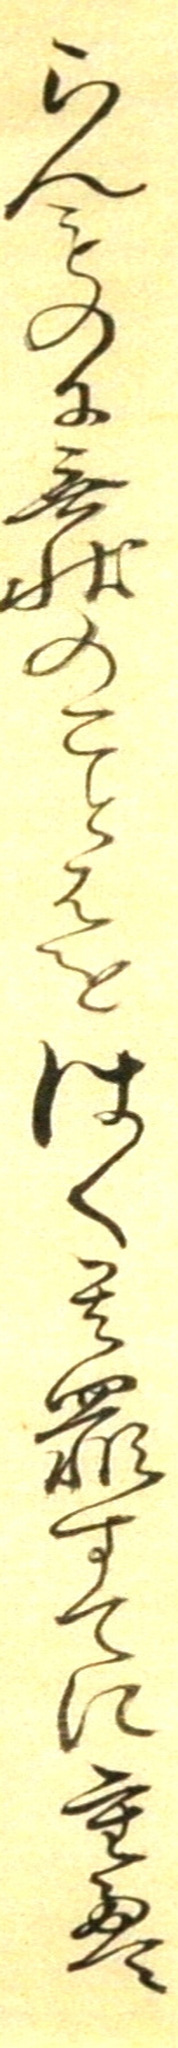らんものに無状のことはをはく其罪すてに重畳
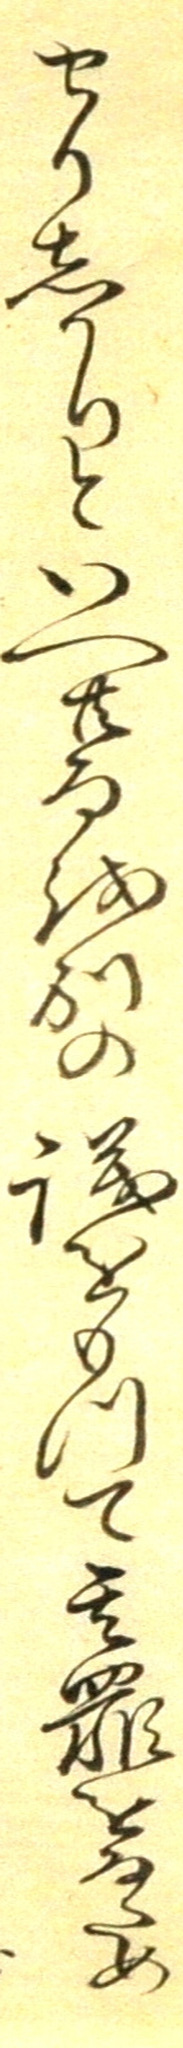せりしかりといへ共なを別の議をもつて其罪をなため

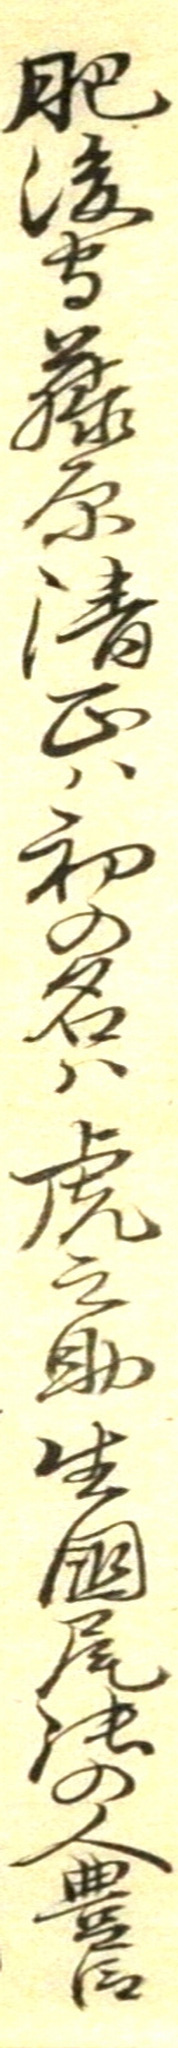肥後守藤原清正は初の名虎の助生国尾張の人豊臣
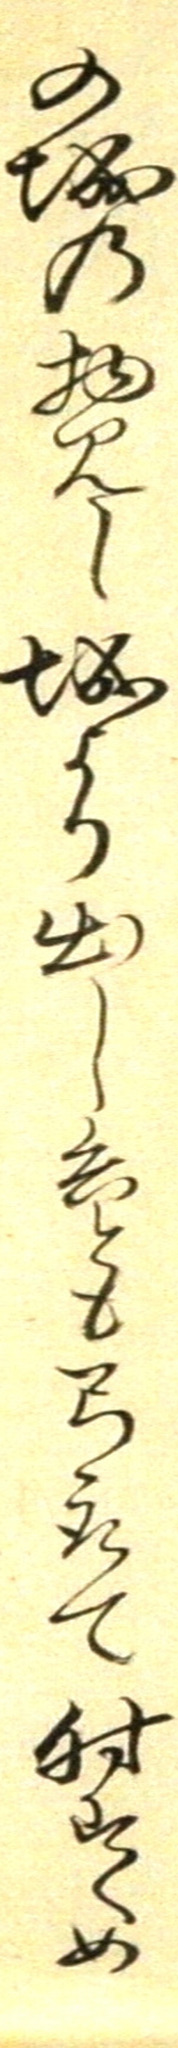の堀の物見し城より出し兵とも弓取て射すくめ

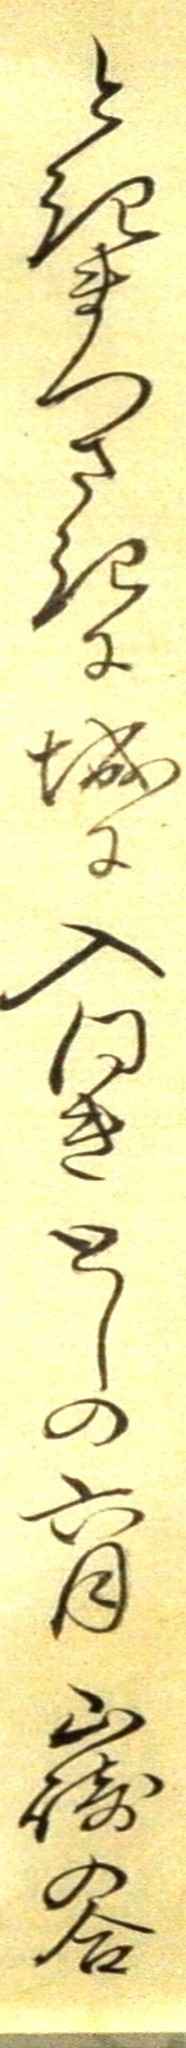ときまつさきに城に入同きとしの六月山崎の合
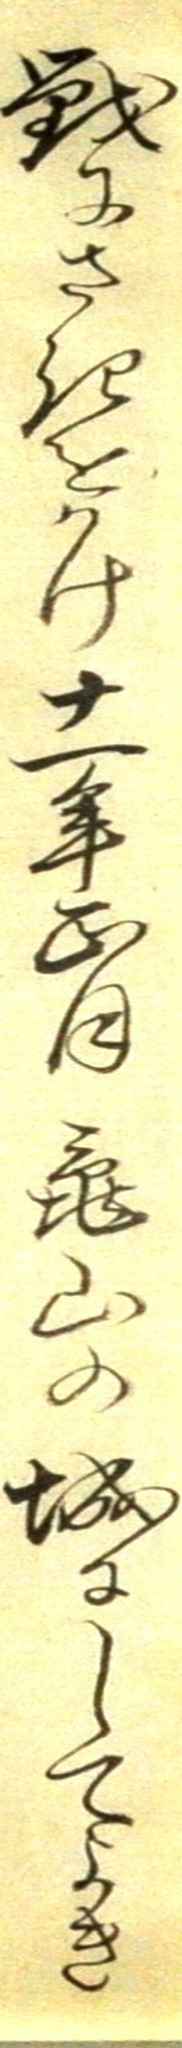戦にさきをかけ十一年賞正月亀山の城にしてよき
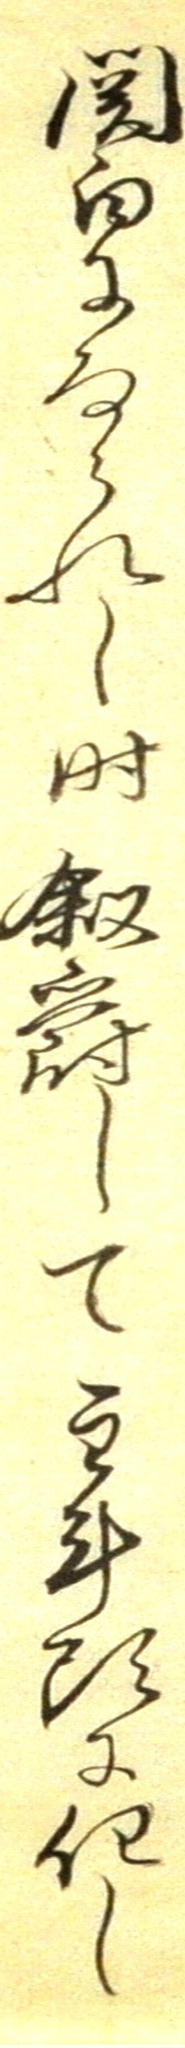関白になられし時叙爵して主計頭に任し
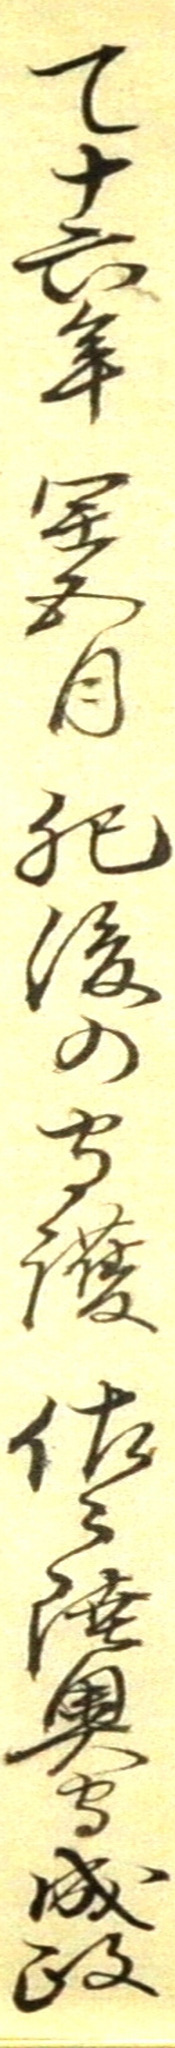て十六年閏五月肥後の守護佐々陸奥守成政
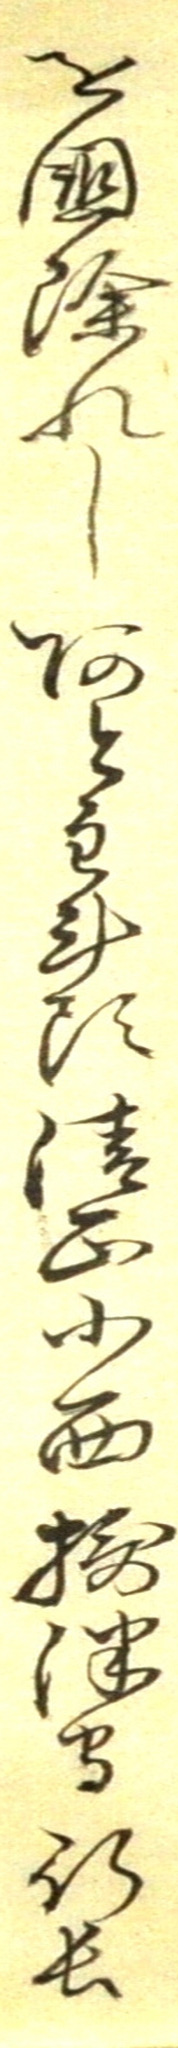を国除れしあと主計頭清正に小西摂津守行長
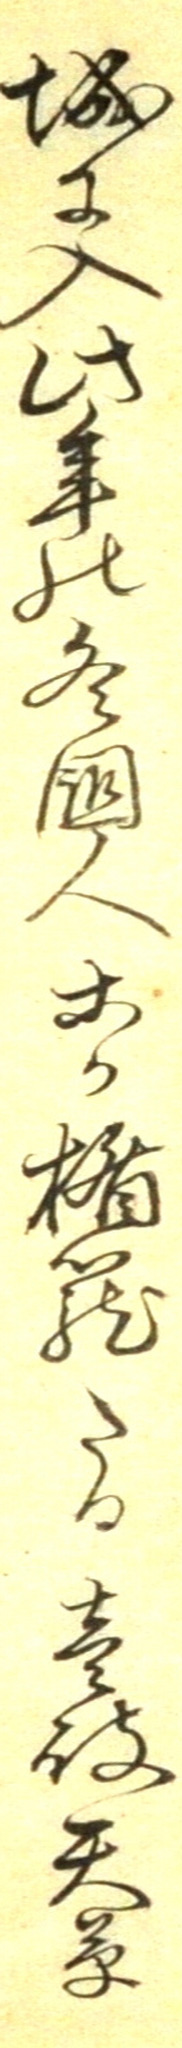城に入此年の冬国人等か楯蔵たる壱岐天草
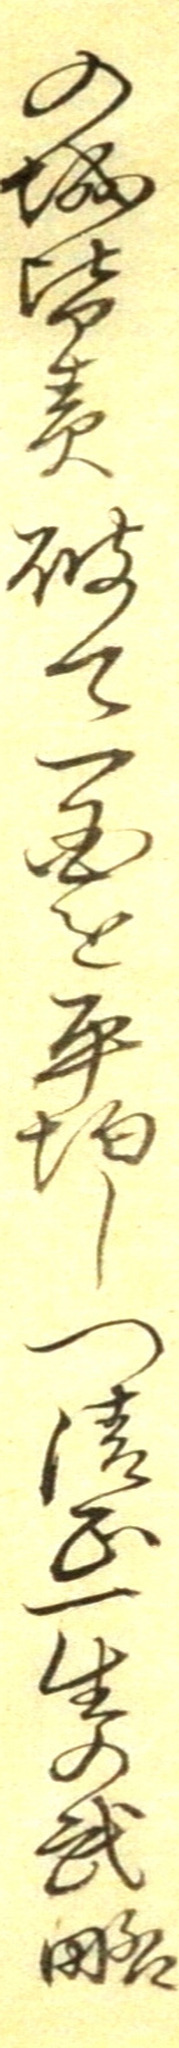の城皆責破て一国を平均しつ清正一生の武略
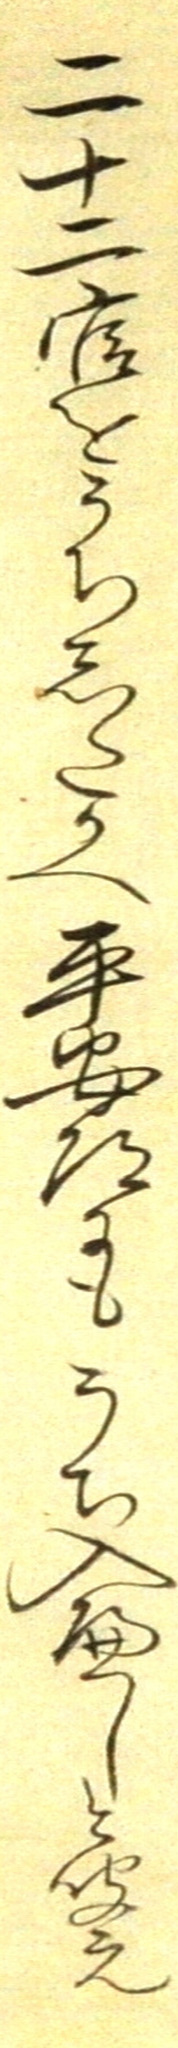二十二官をうちしたかへ平安道にもうち入へしと聞え
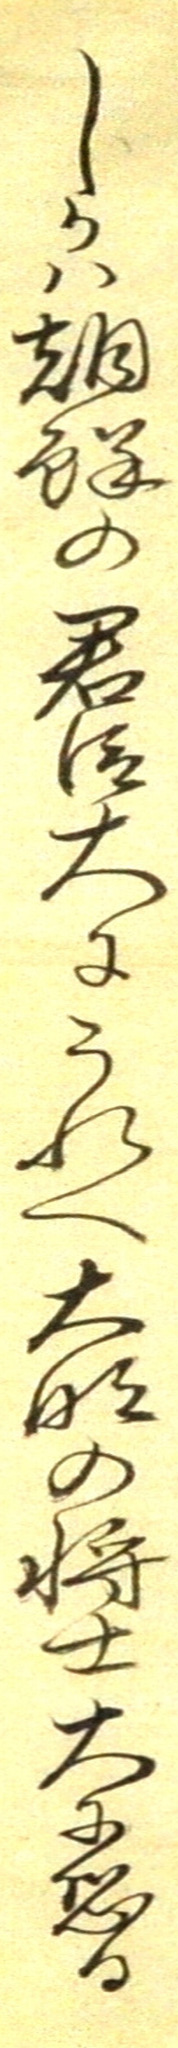しかは朝鮮の君臣大にうれへ大明の将士大に恐る

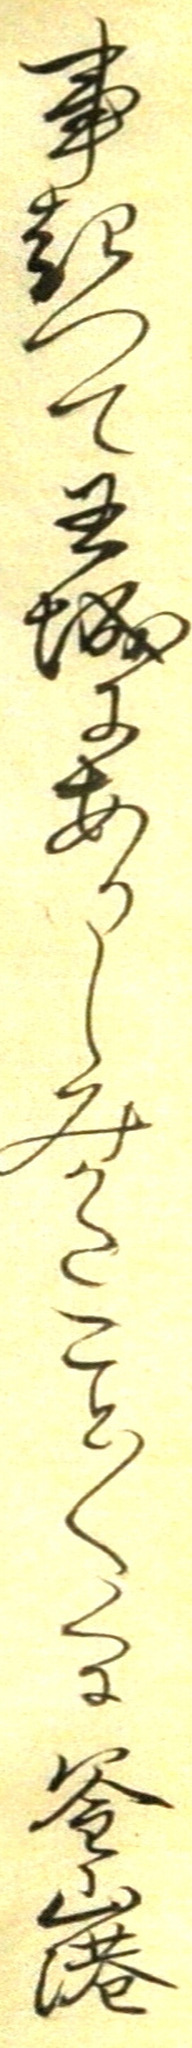事起つて王城にありしみかたこと〳〵くに釜山港
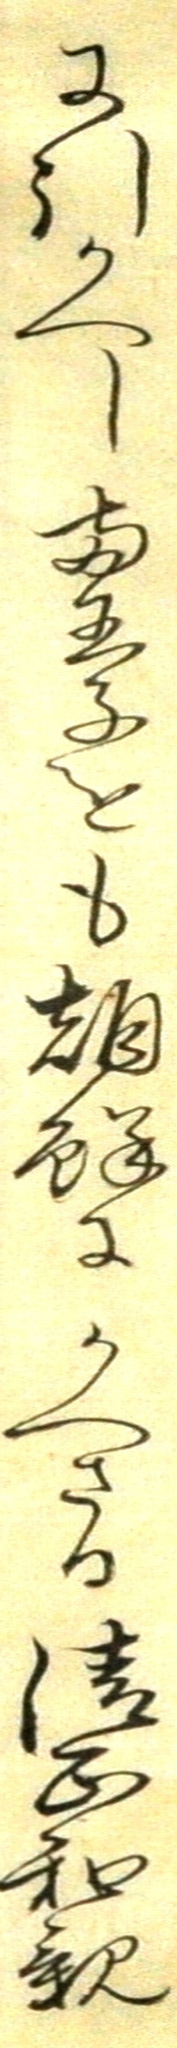に引かへし両王子をも朝鮮にかへさる清正和親
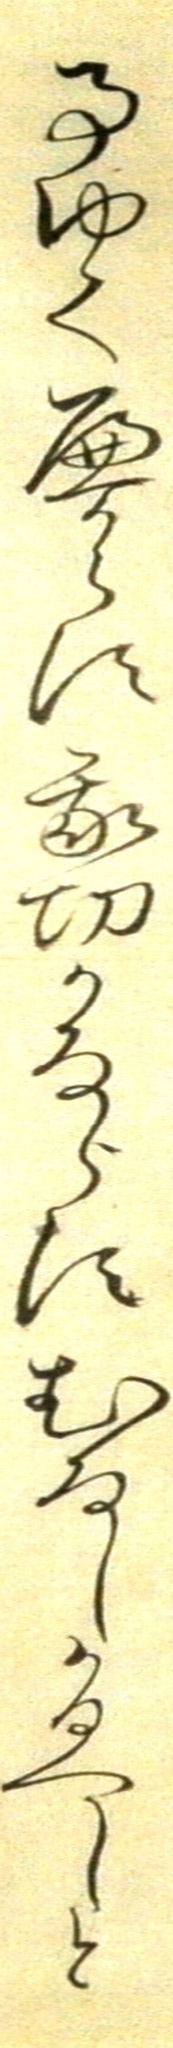事ゆくへからす我切かならすむなしかるへしと
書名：藩翰譜（十二・上）
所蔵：伊那市立高遠町図書館・合同会社AMANE
